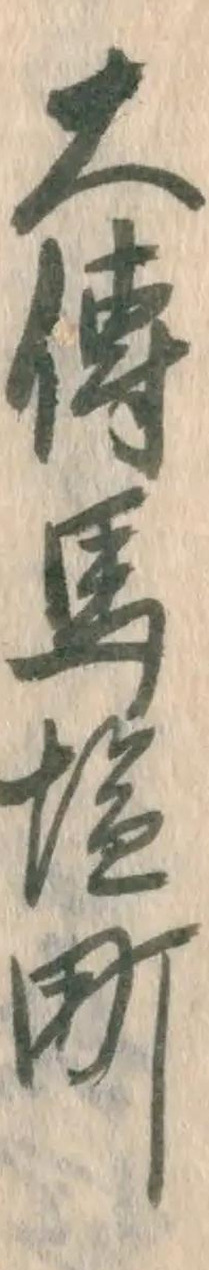大伝馬塩町
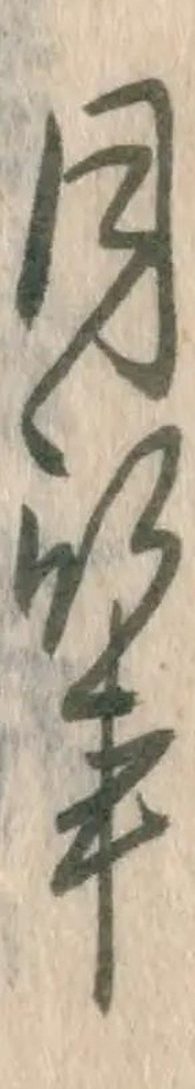月行事
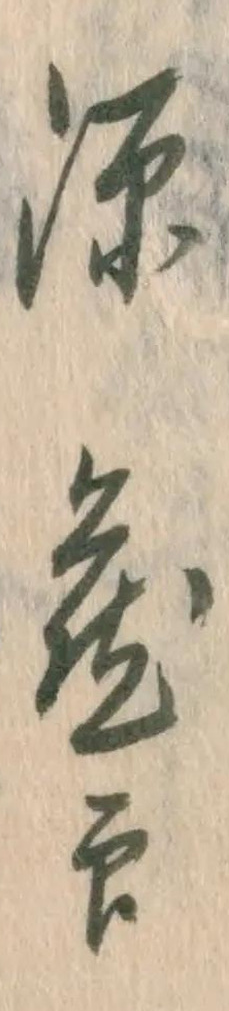源蔵印
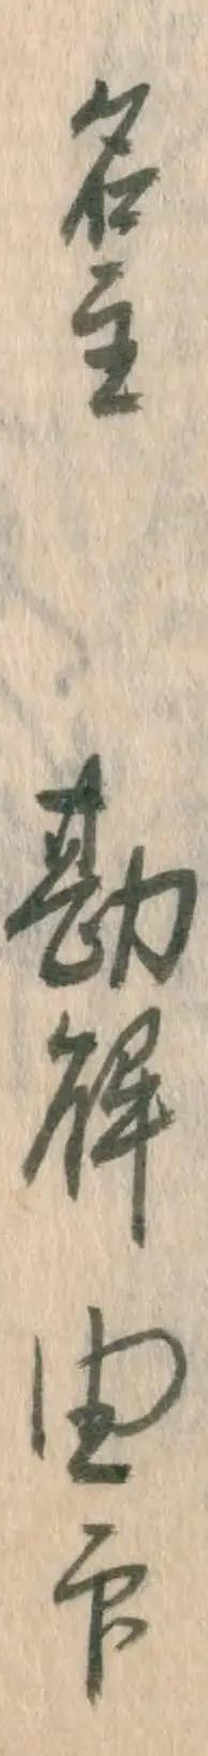名主勘解由印
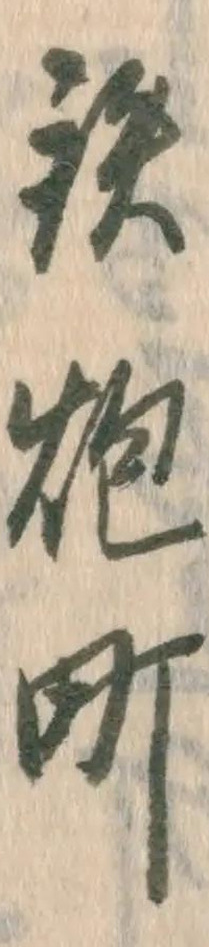鉄炮町
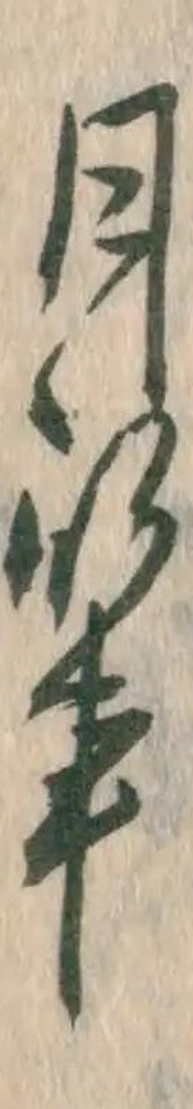月行事
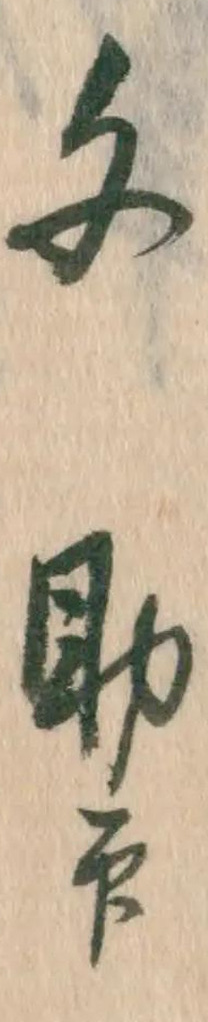与助印
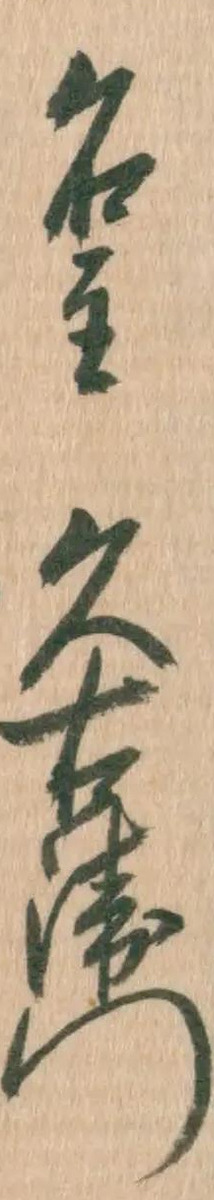名主久右衛門
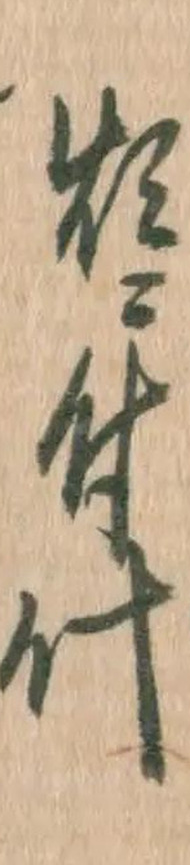煩ニ付代
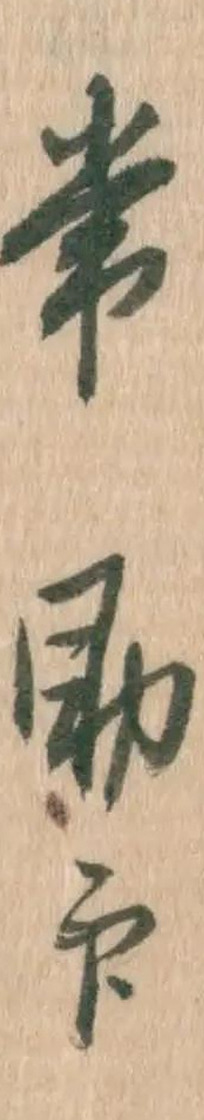常助印
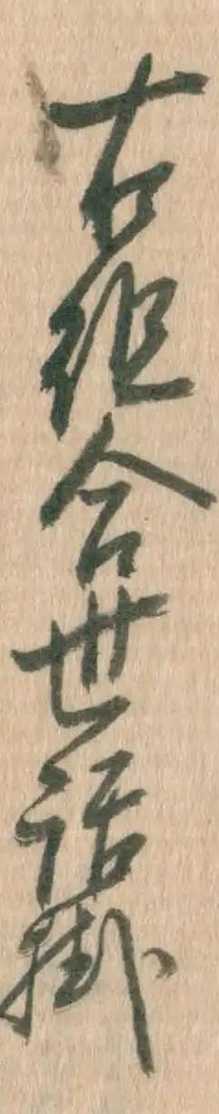右組合世話掛
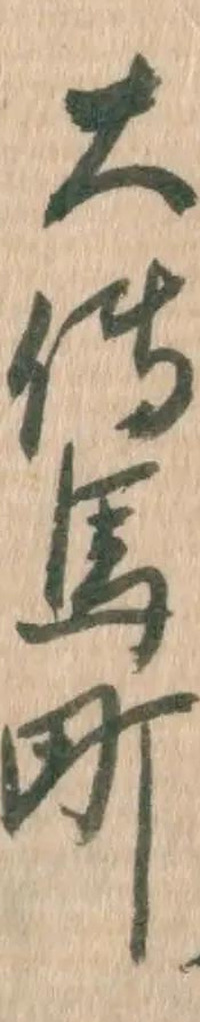大伝馬町
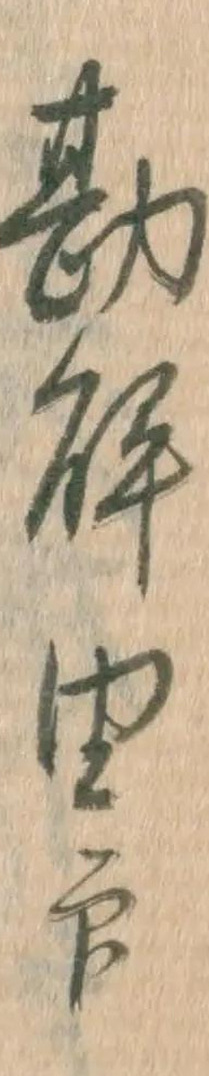名主勘解由印
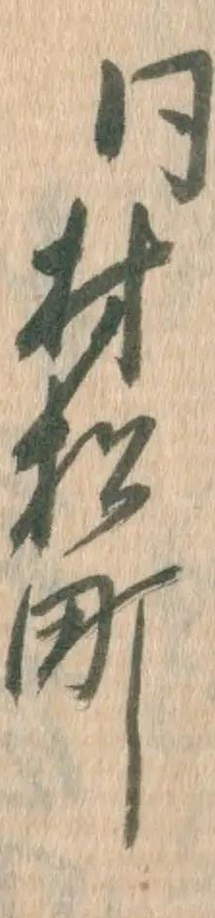同村松町
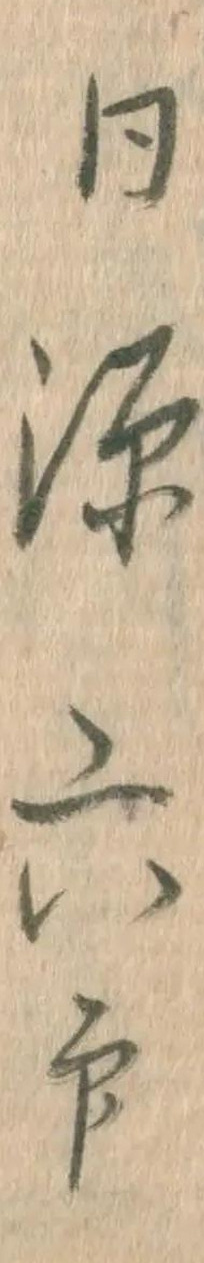同源六印

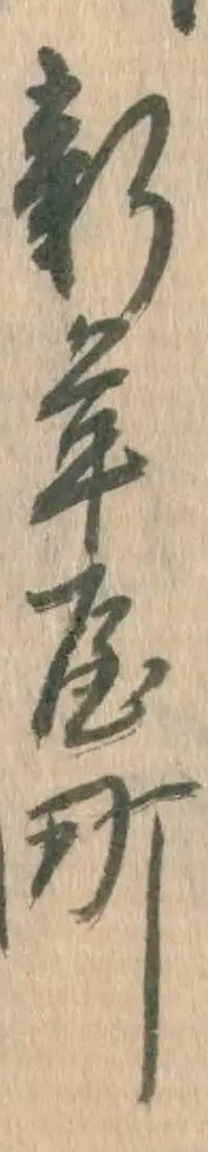新葺屋町
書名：七十冊物類集 71巻. [44] 四十三 牢屋敷御普請御修覆地震ニ付骨折候牢屋掛御褒美之部
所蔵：国立国会図書館 National Diet Library, JAPAN
